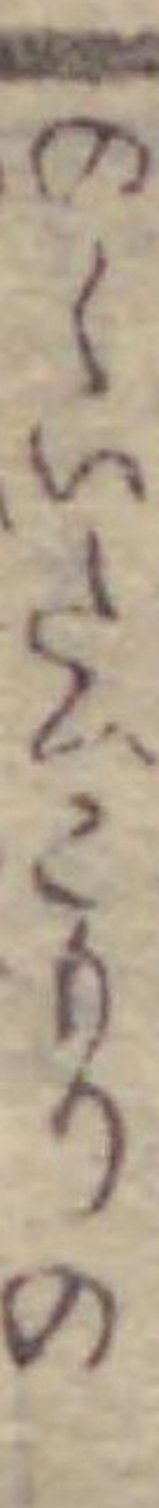のくいたひこもりの
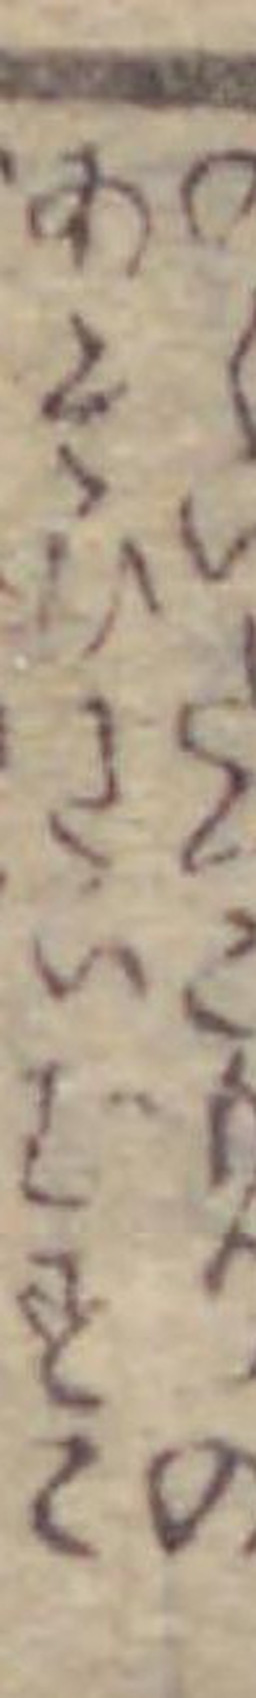あそひたいむすこ
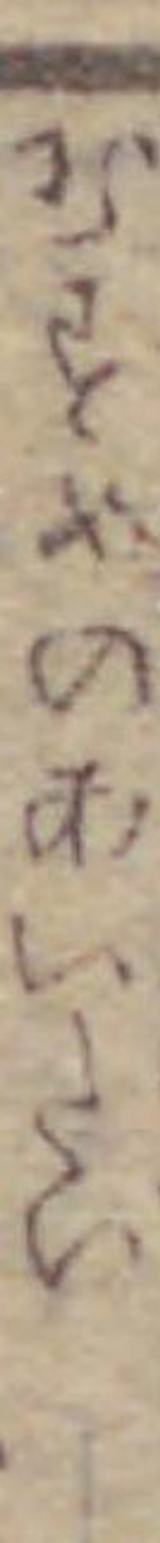むすめのあいたい
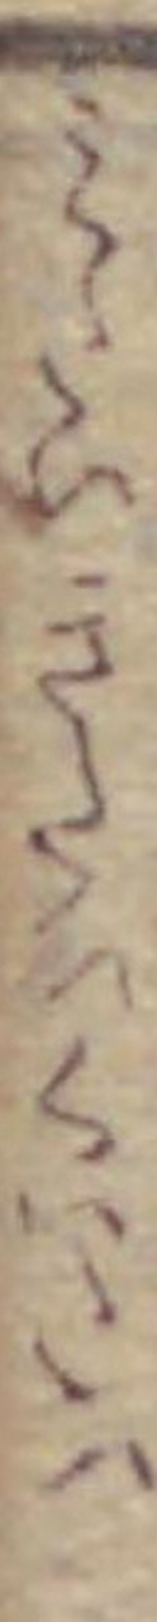みたいきたひくいたい
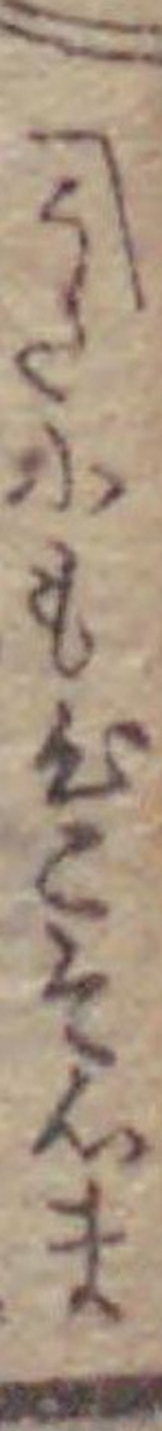〽うたにも心こそ心ま
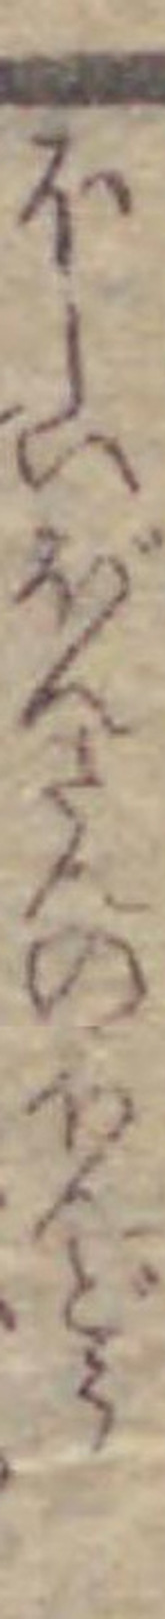ほしいぼんさんのほんどう
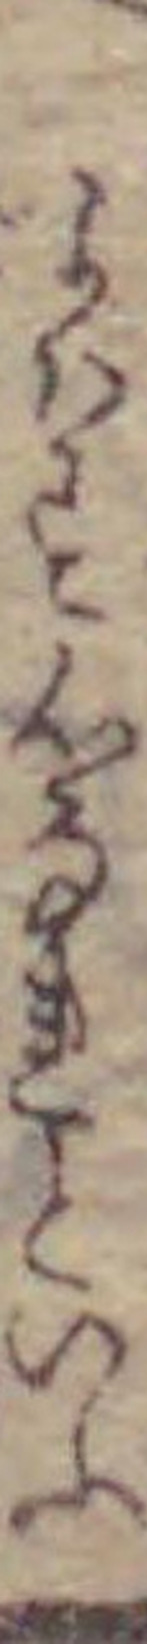よはす心なれといふ
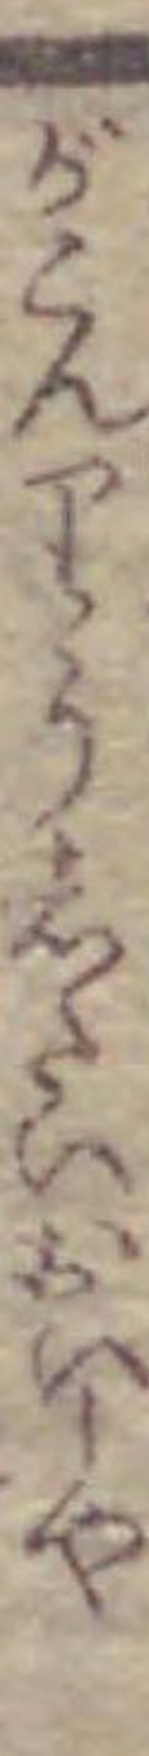がこんりうしたいおいしや
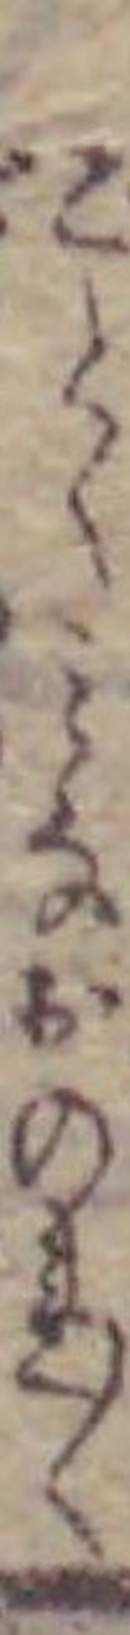ごとくみなおのれ〳〵
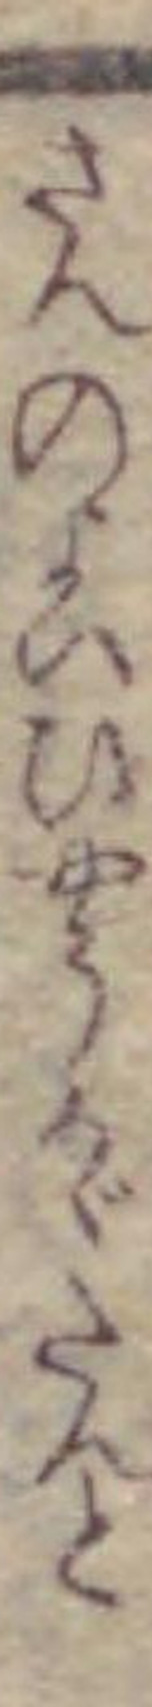さんのよいひやうかゞたんと
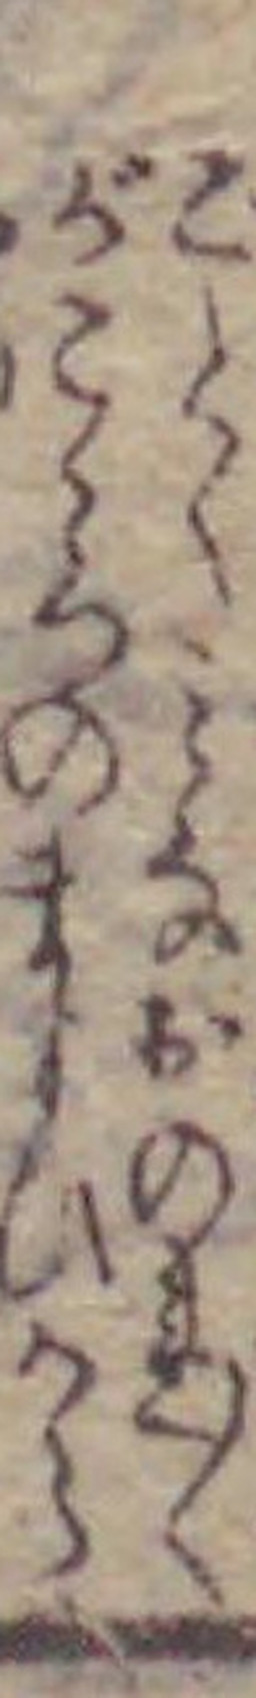がこゝろのまよひから
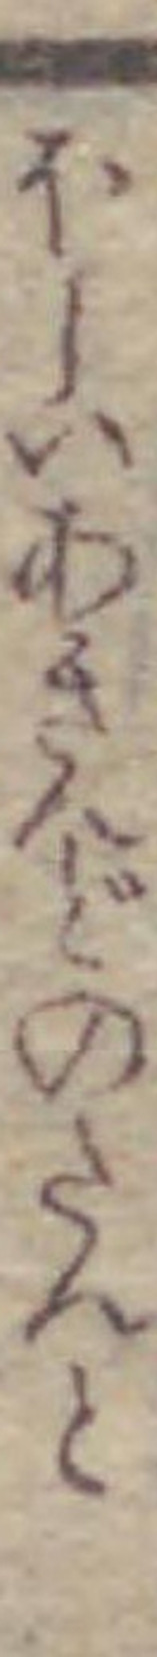ほしいあきんどのたんと
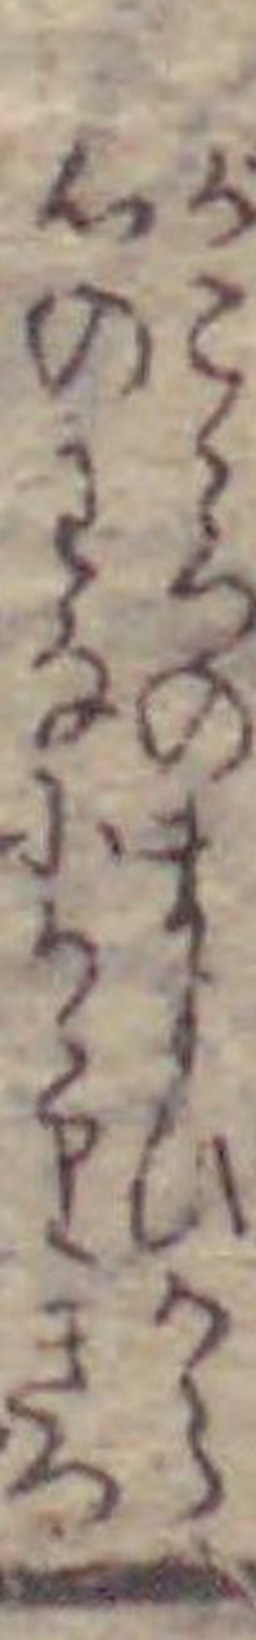心のわなにかゝりきつ
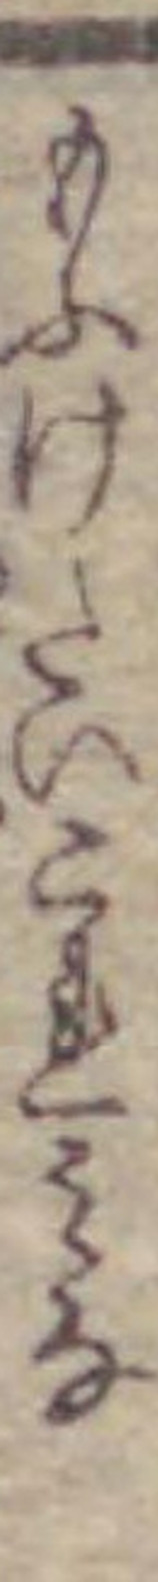もふけたいこれみな
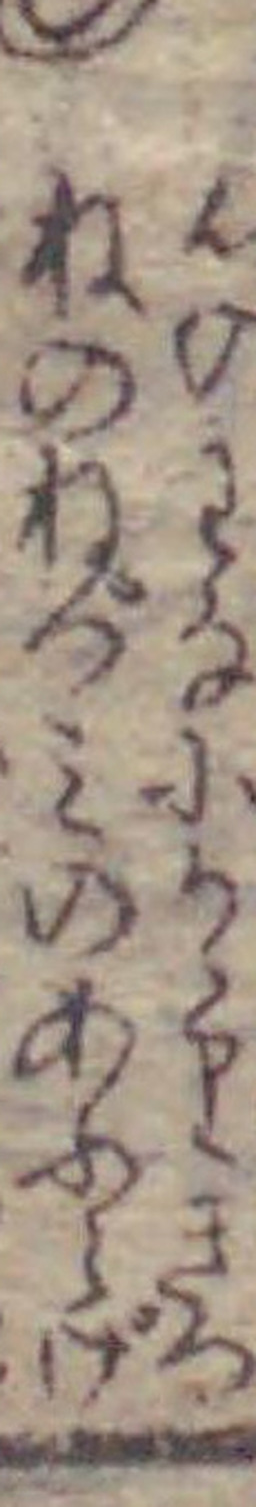ねのねづみのあふらげ
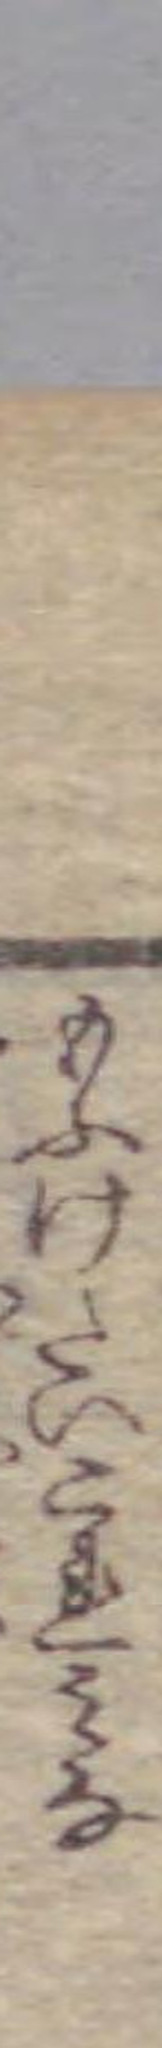もふけたいこれみな
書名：鼻下長生薬 : 3巻
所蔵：国立国会図書館 National Diet Library, JAPAN
